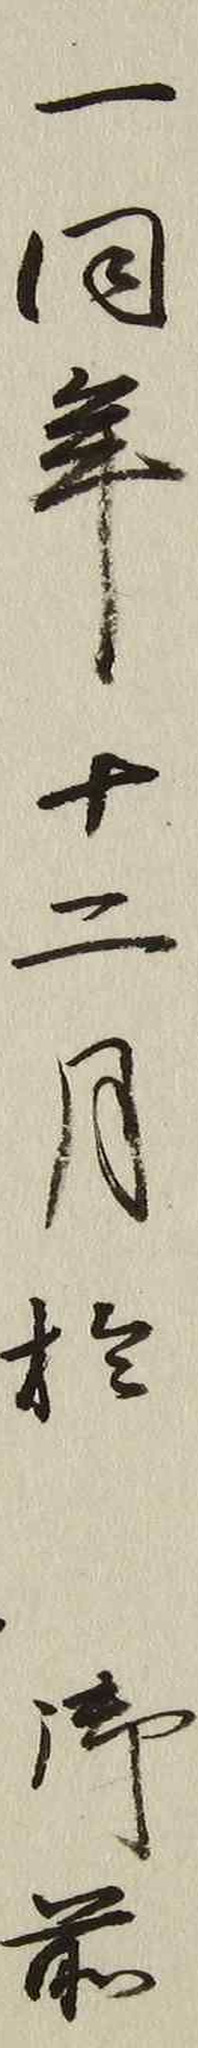一同年十二月於御前
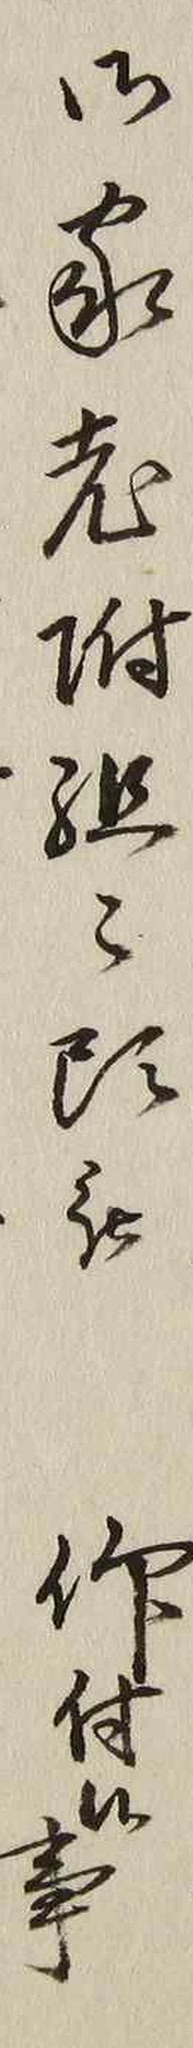御家老附組々頭被仰付候事
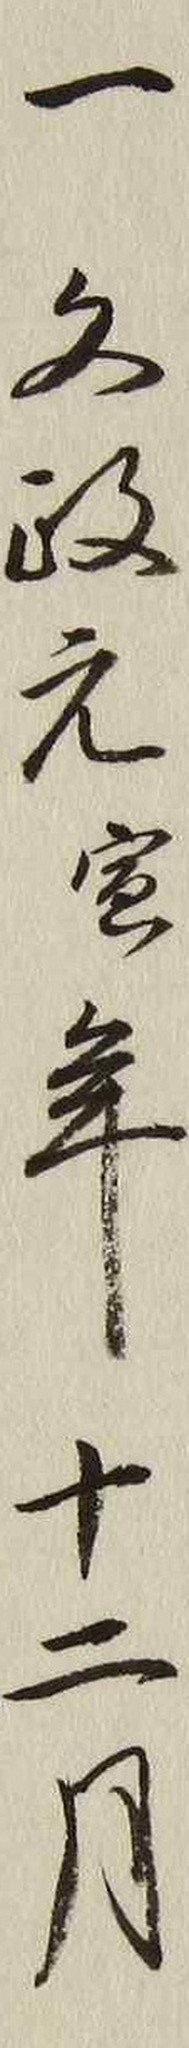一文政元寅年十二月
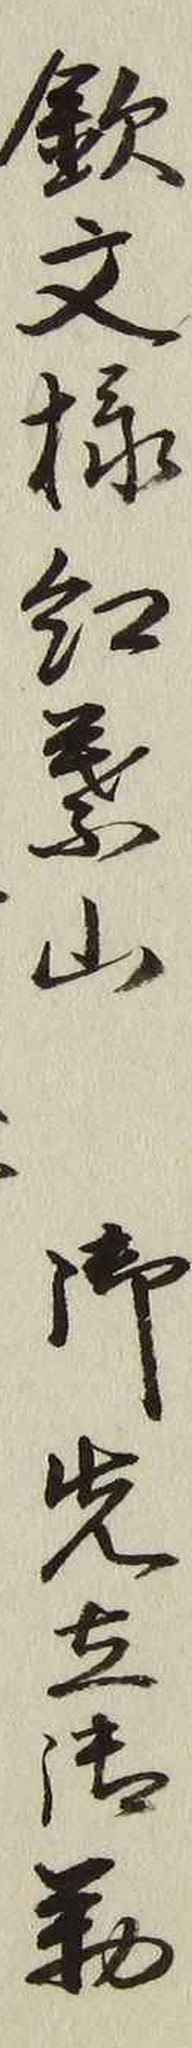欽文様紅葉山御先立御勤
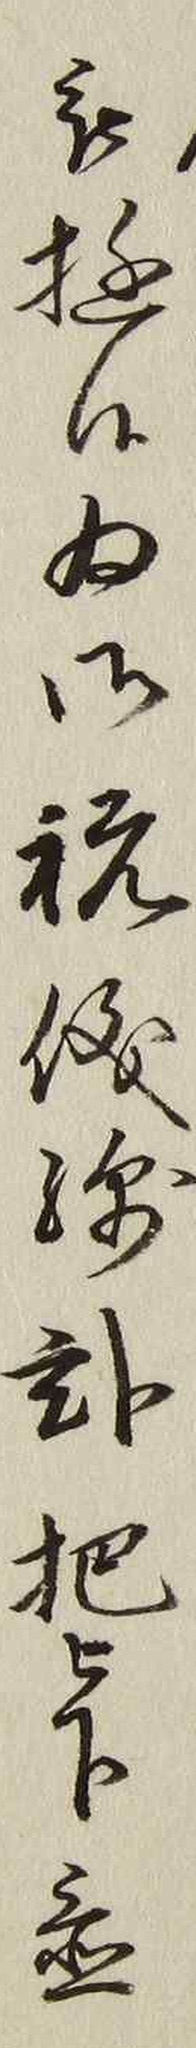被遊候為御祝儀綿弐把被下置
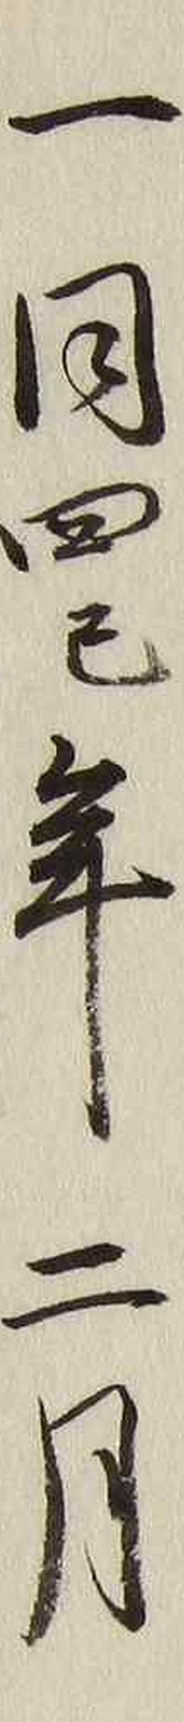一同四巳年二月
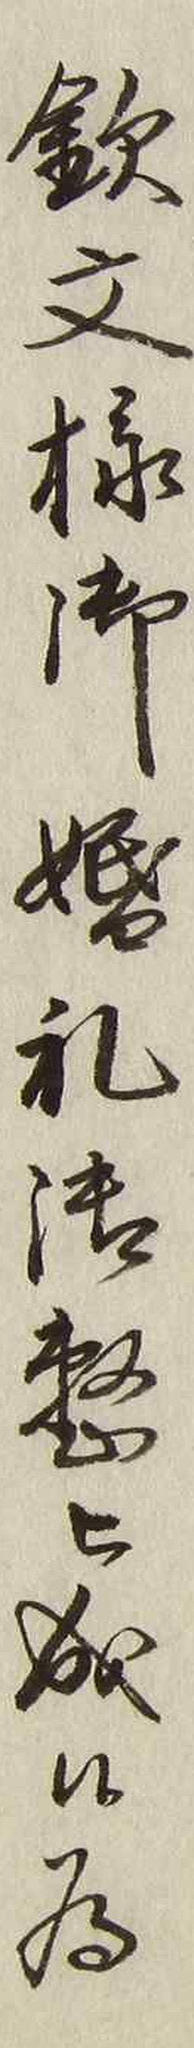欽文様御婚礼御整被成候為
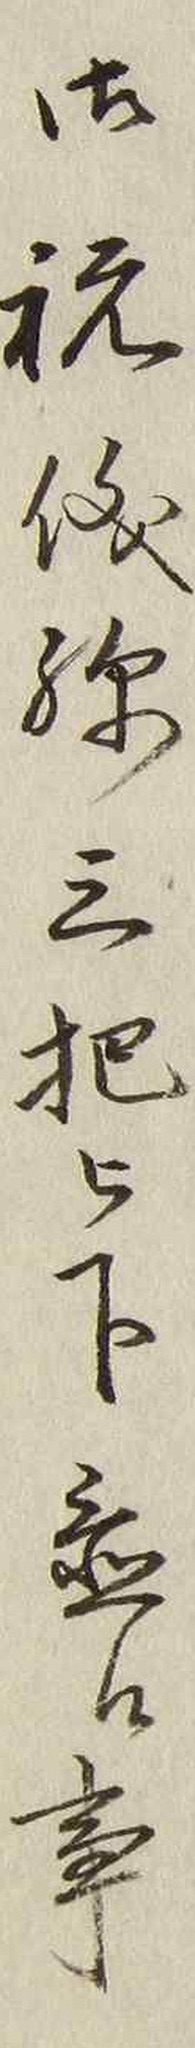御祝儀綿三把被下置候事

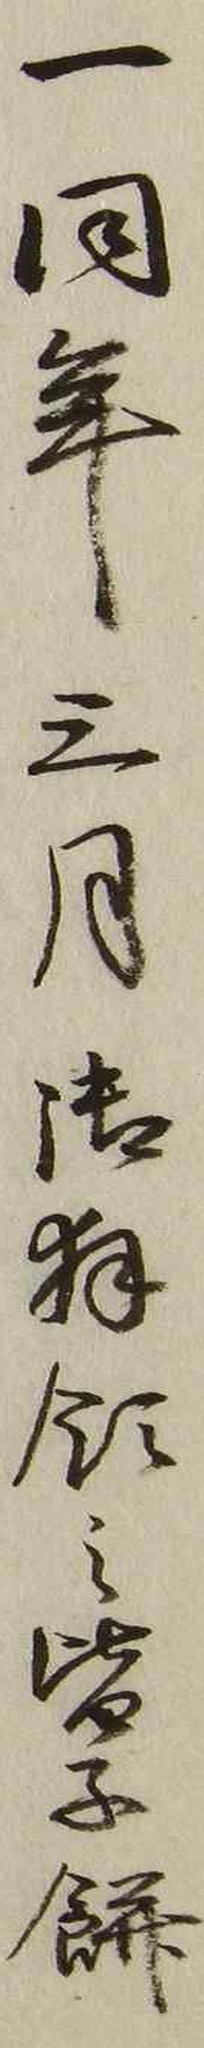一同年三月御拝領之皆子餅
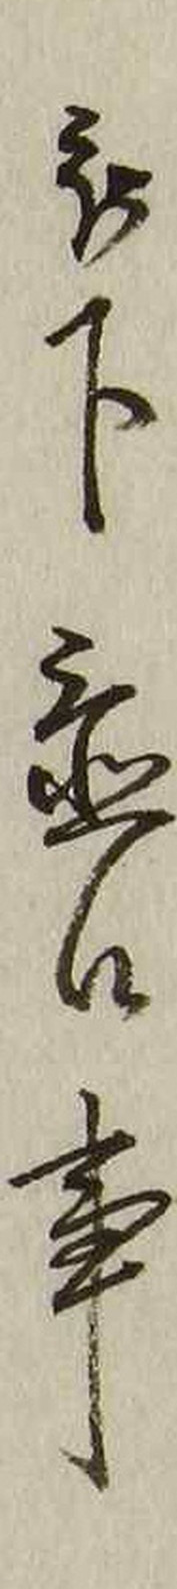被下置候事
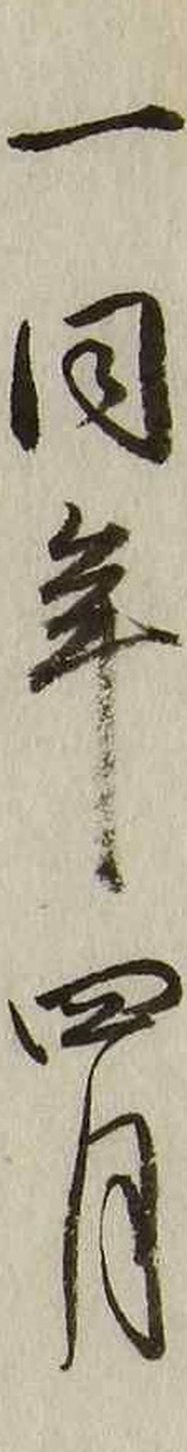一同年四月
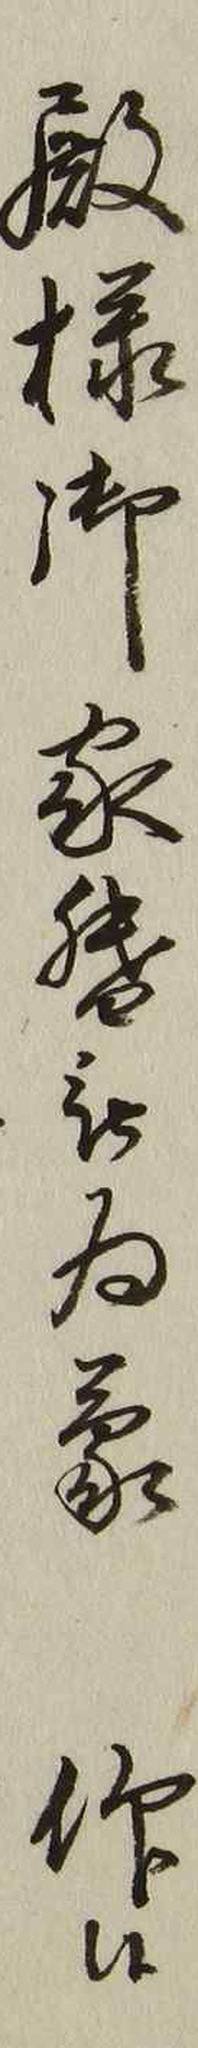殿様御家督被為蒙仰候
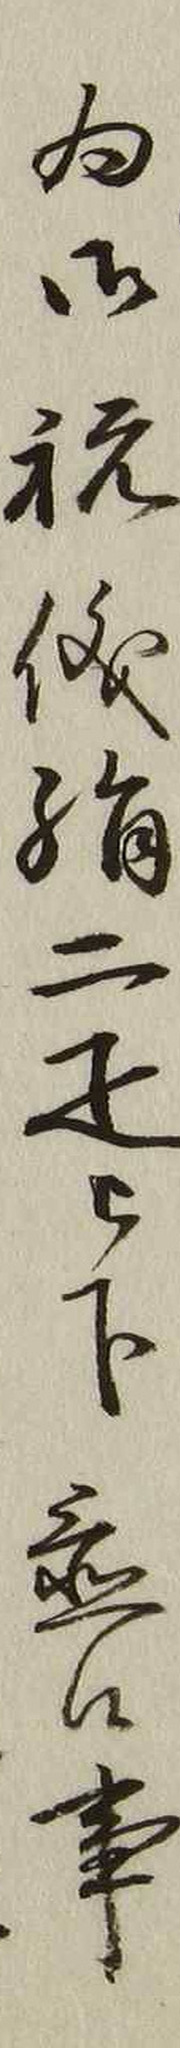為御祝儀絹二疋被下置候事
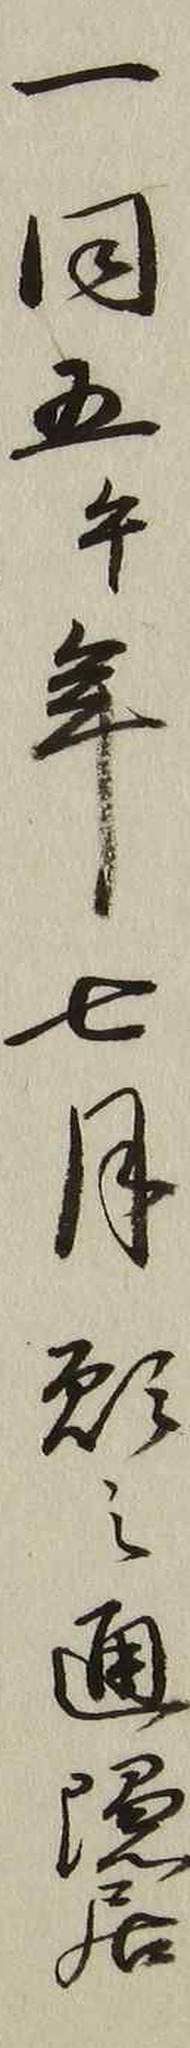一同五午年七月願之通隠居
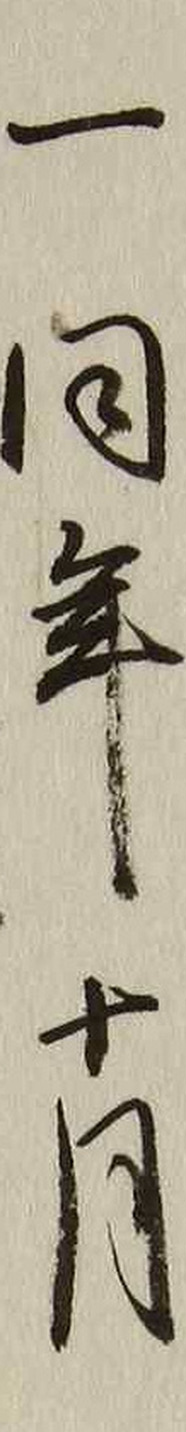一同年十月
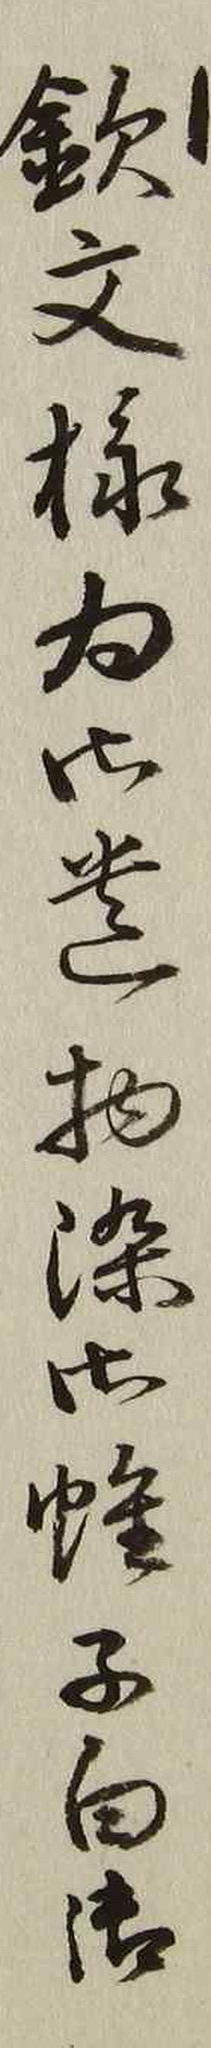欽文様為御遺物染御帷子白御
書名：諸士系譜　巻之136　た之部12
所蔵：会津若松市立会津図書館
